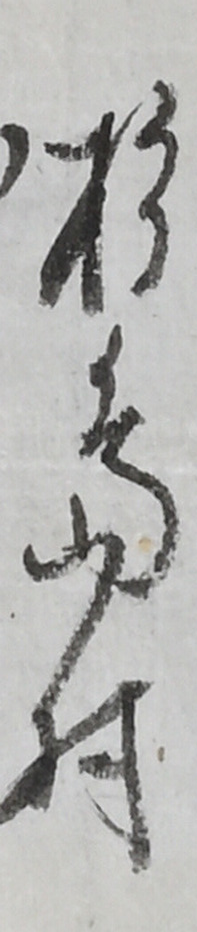杉嶋村
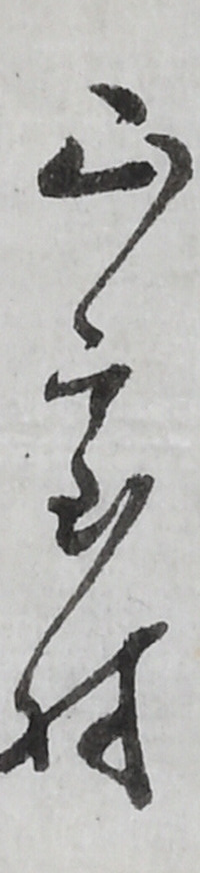山室村
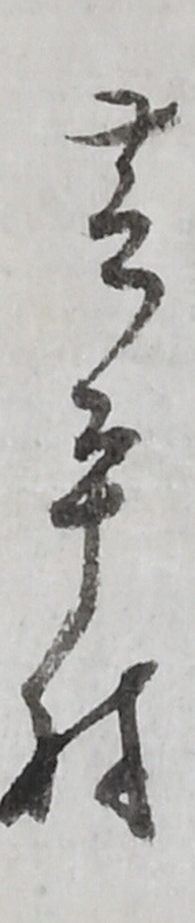芝平村
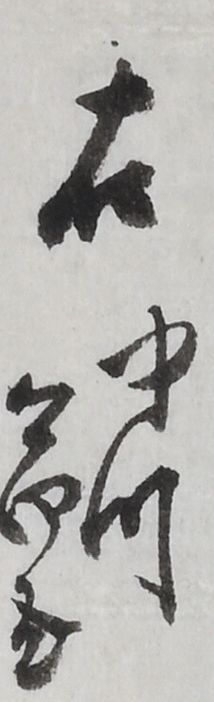右中町
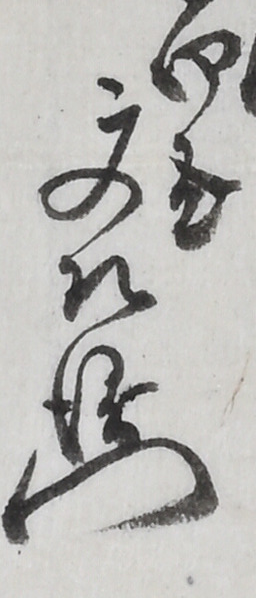文左衛門
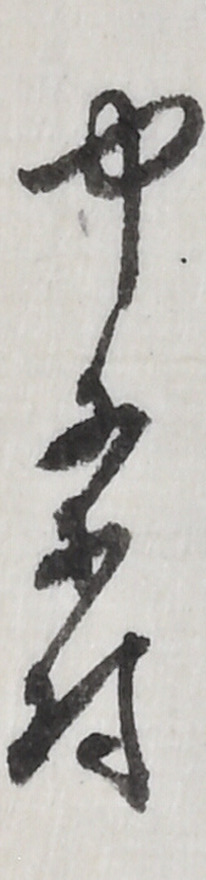中条村
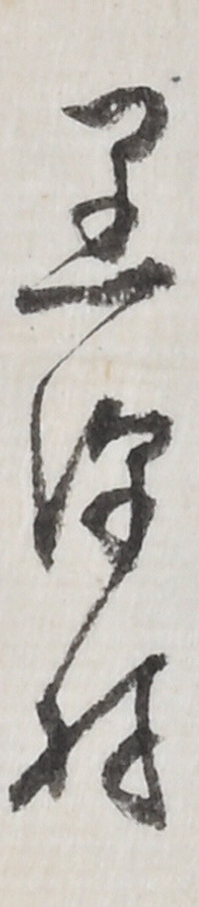黒沢村
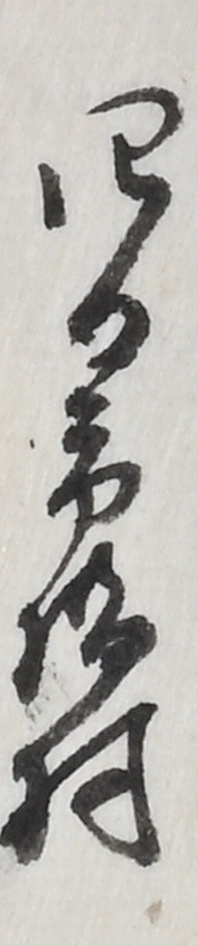四日市場村
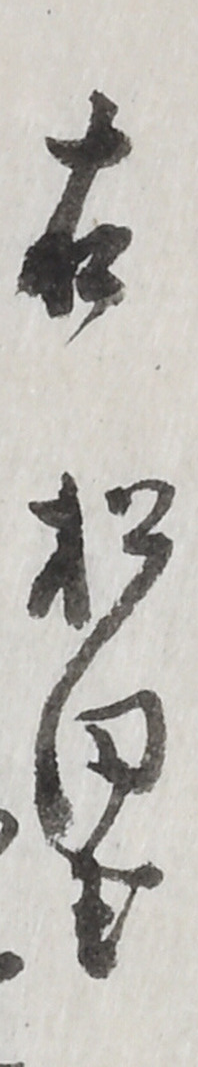右松田屋
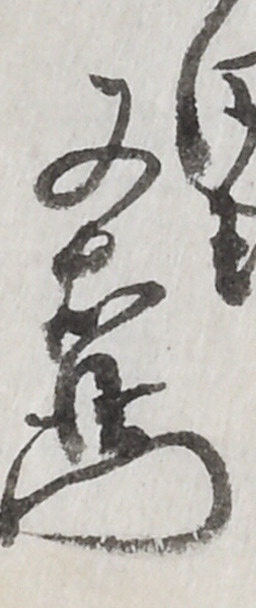又右衛門
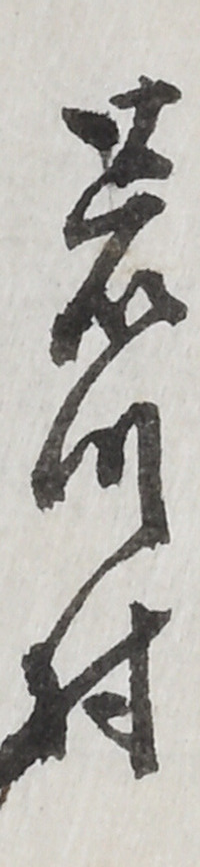荒町村
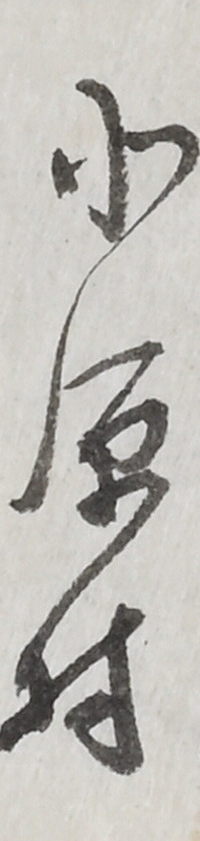小原村
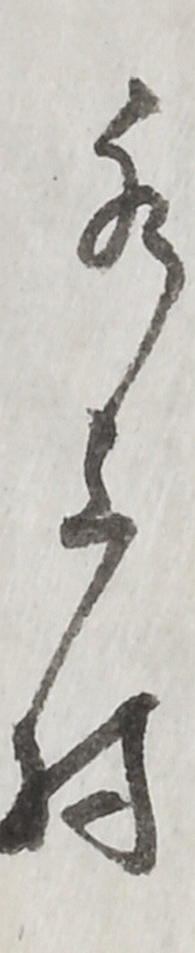水上村
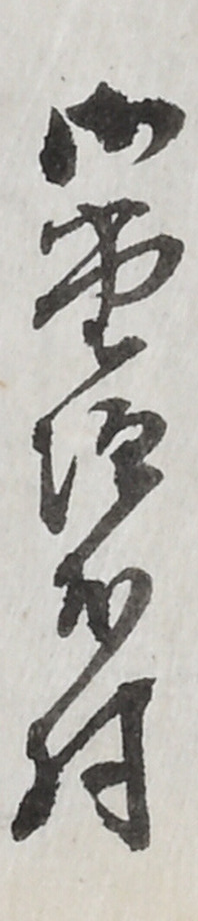御堂垣外村
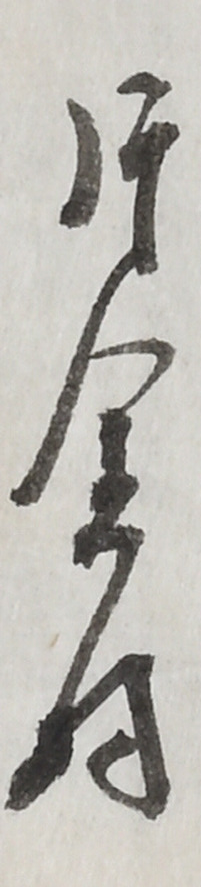片倉村
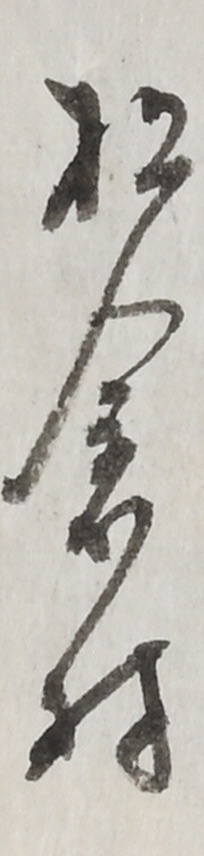松倉村
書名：年内行事帳
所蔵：伊那市立高遠町図書館・合同会社AMANE
